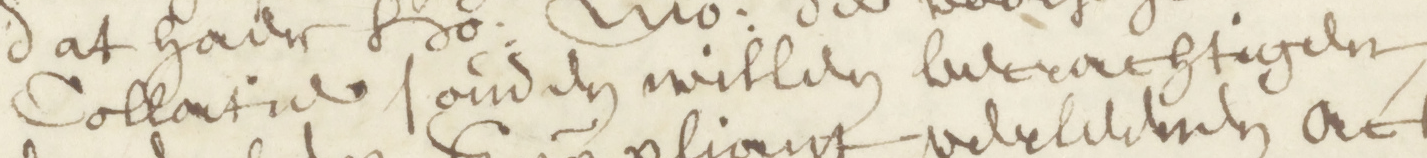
Collatie souden willen becrachtigen
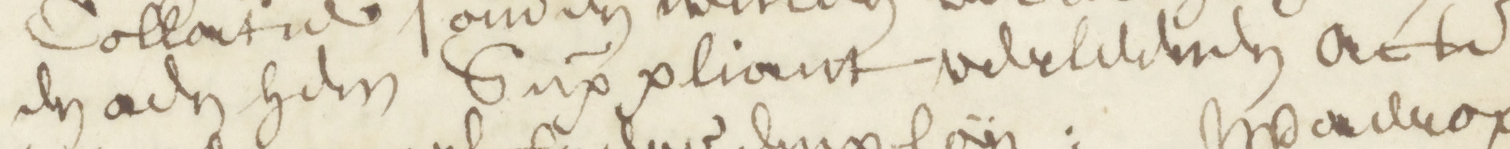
en aen hem Suppliant verleenen acte
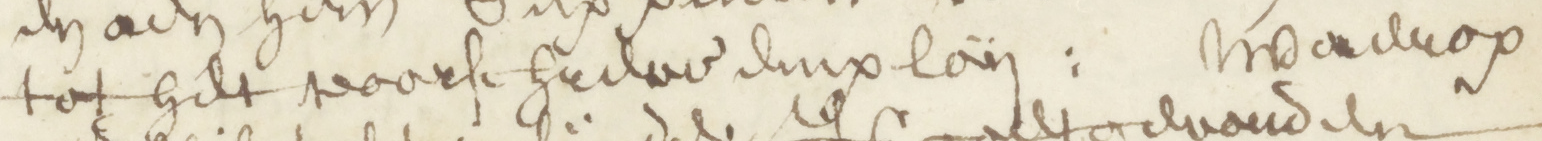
tot het voorschreve emploij: Waerop
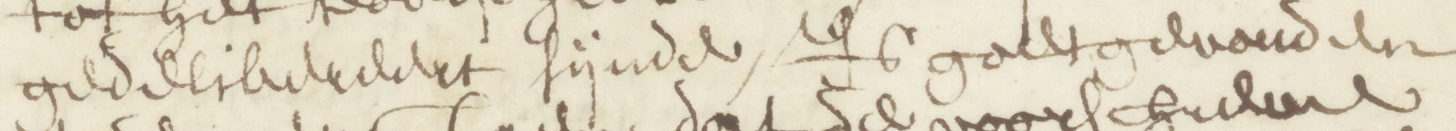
gedelibereert sijnde, Is goetgevonden
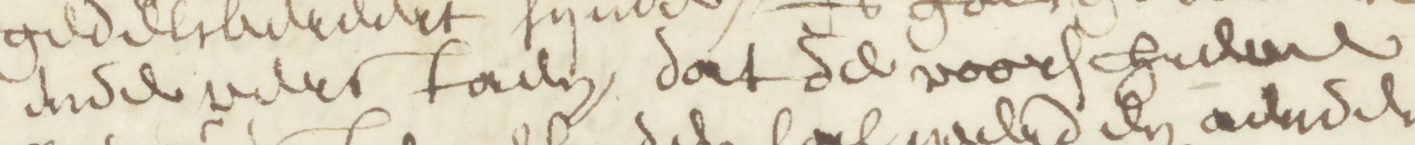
ende verstaen, dat de voorschreve
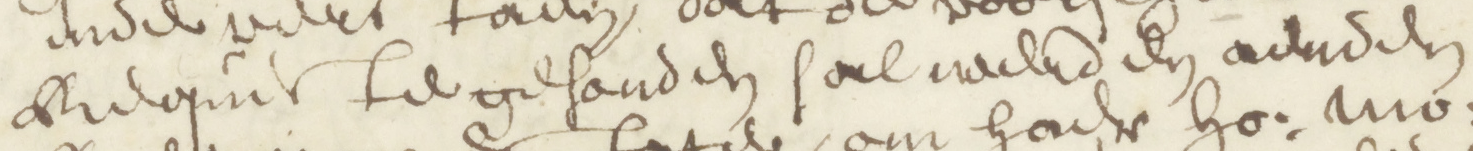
Requeste gesonden sal werden aenden
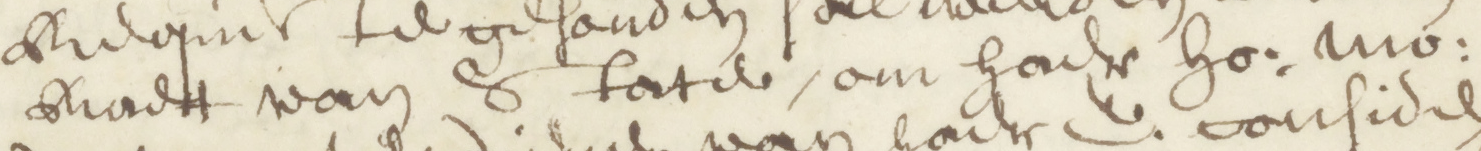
Raet van State, om haer Ho:Mo:
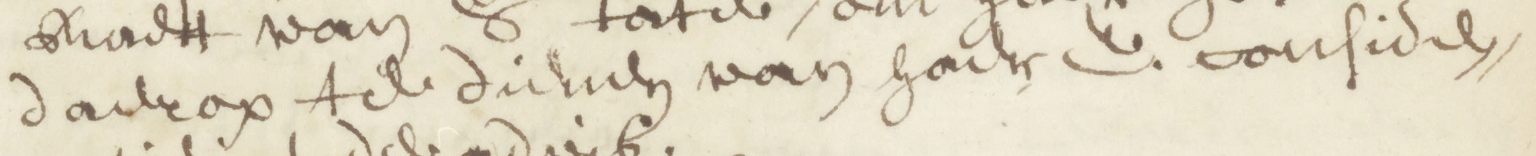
daerop te dienen van haer E. conside„
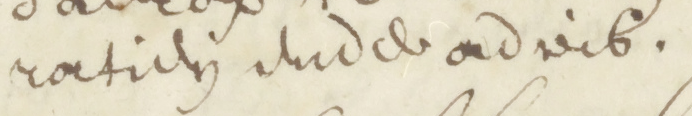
ratien ende advis.
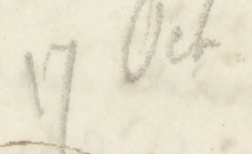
17 Oct
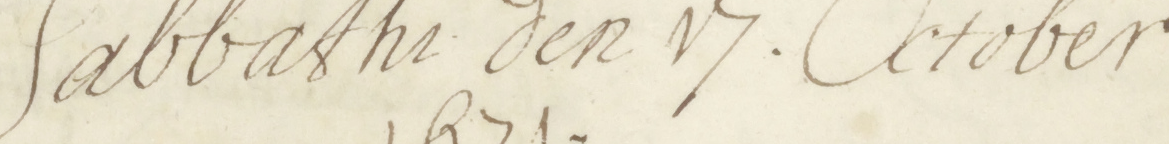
Sabbathi den 17e. October
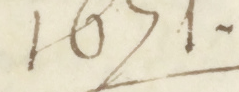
1671.
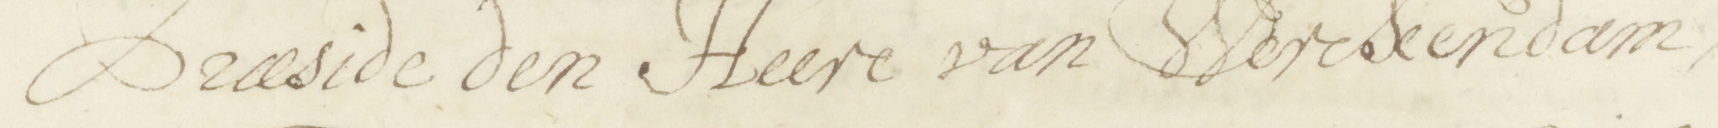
Præside den Heere van Werkendam
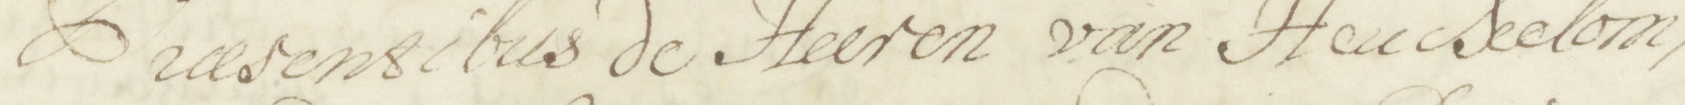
Præsensibus de Heeren van Heuckelom,
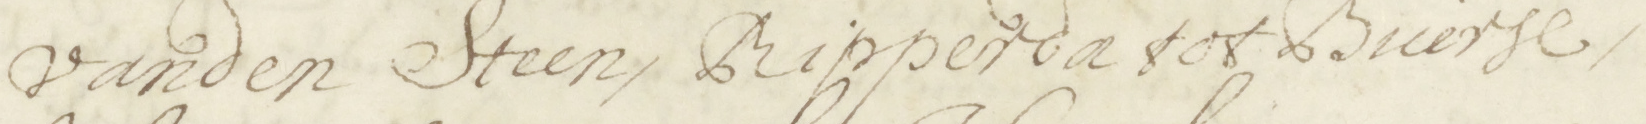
vanden Steen, Ripperda tot Buirse,
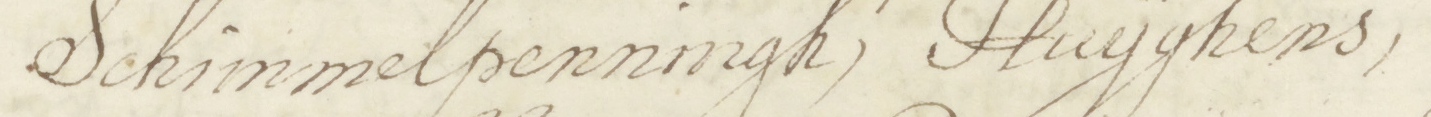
Schimmelpenningh, Huijghens,
